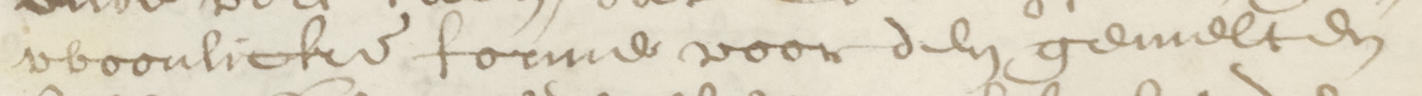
woonlicke forme voor den gemelten
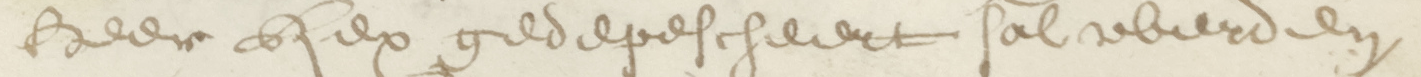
Heer Rex gedepescheert sal werden,
